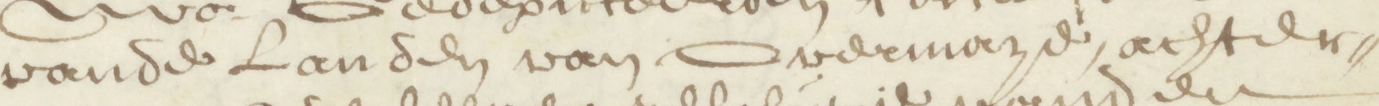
vande Landen van Overmaze, achter„
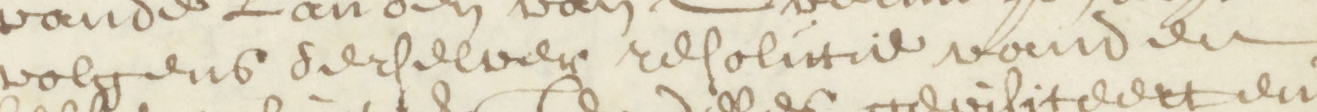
volgens derselver resolutie vanden
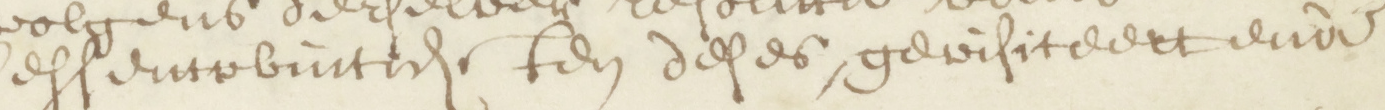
sessentwintichsten deses, gevisiteert ende
